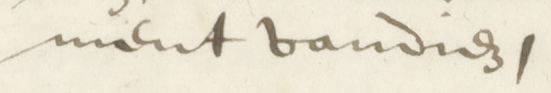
ment vandien.
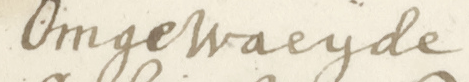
Omgewaeijde
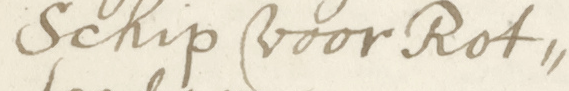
schip voor Rot„
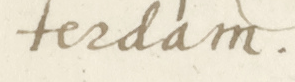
terdam
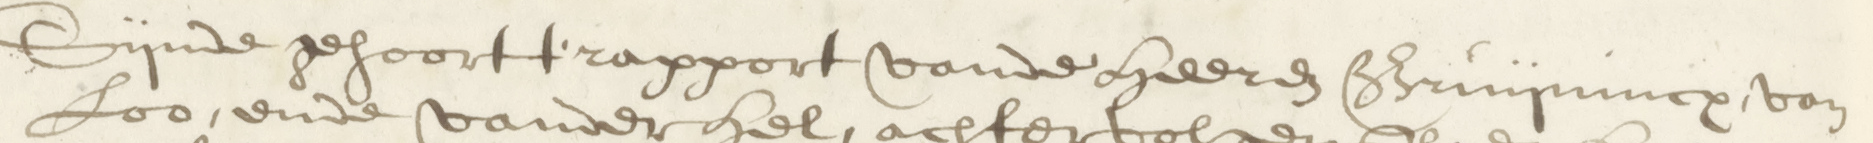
Sijnde gehoort t'rapport vande heeren Bruijnincx, van
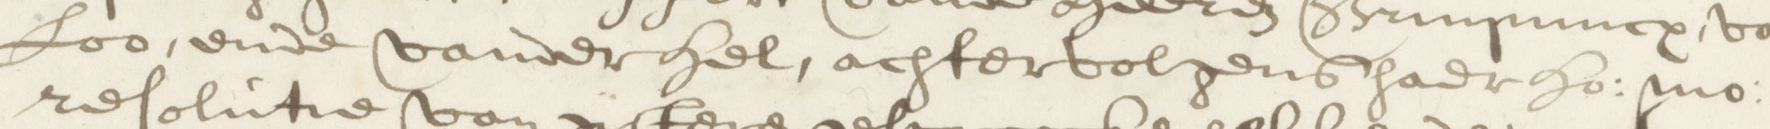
Loo, ende vander Hel, achtervolgens haer Ho:mo:
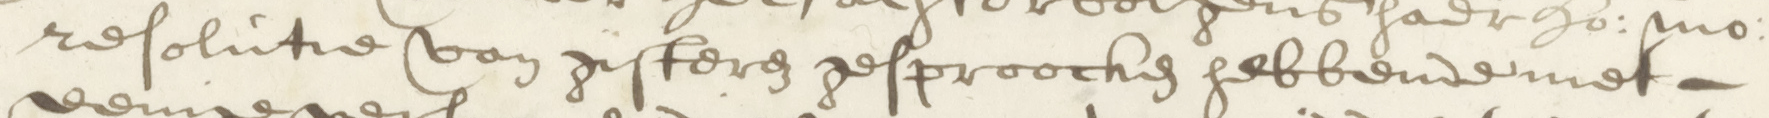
resolutie van gisteren gesproocken hebbende met -
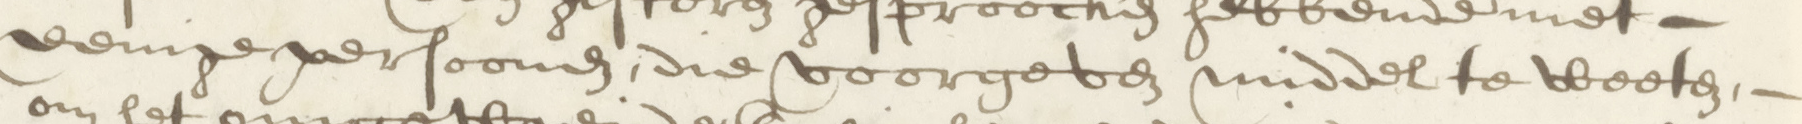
eenige persoonen, die voorgeven middel te weeten, -
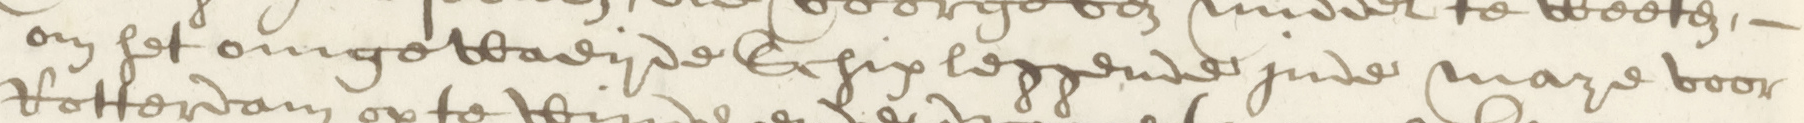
om het omgewaeijde Schip leggende inde Maze voor
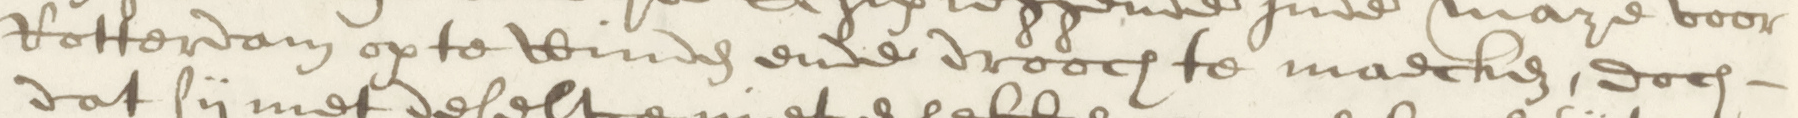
Rotterdam op te winden ende drooch te maecken, doch -
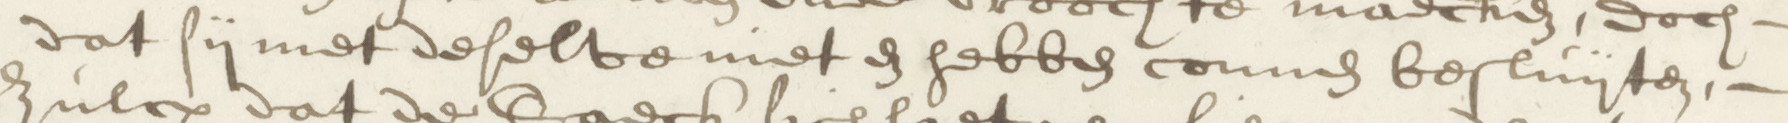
dat sij met deselve niet en hebben connen besluijten, -
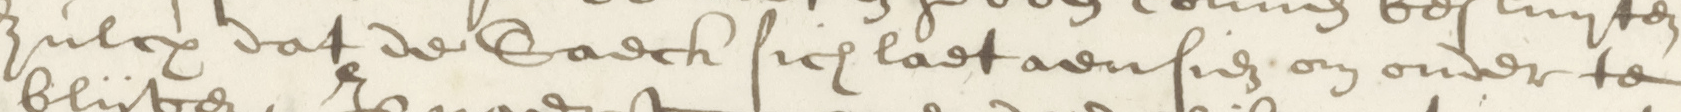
zulcx dat de Saeck sich laet aensien om onder te
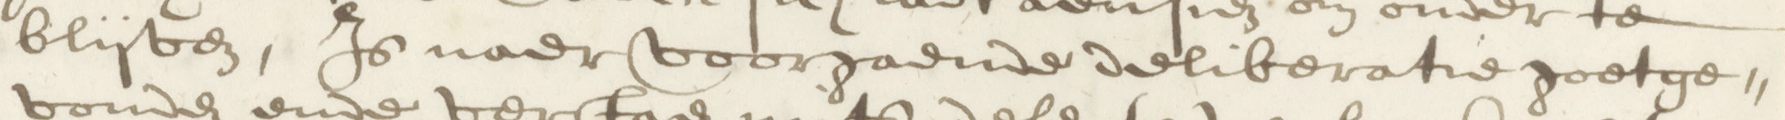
blijven. Is naer voorgaende deliberatie goetge„
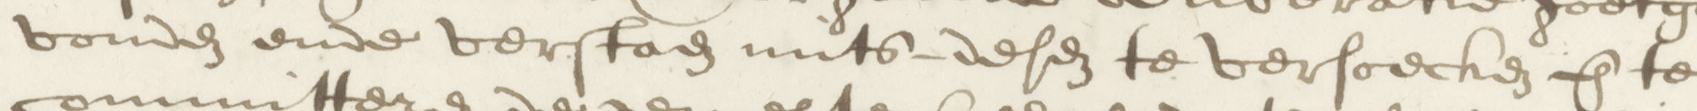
vonden ende verstaen mits desen te versoecken & te
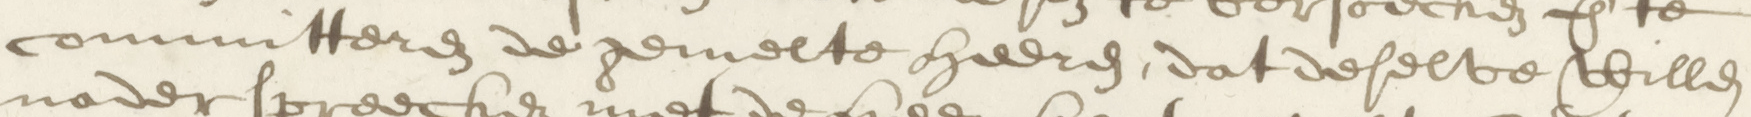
commiteren de gemelte heeren, dat deselve willen
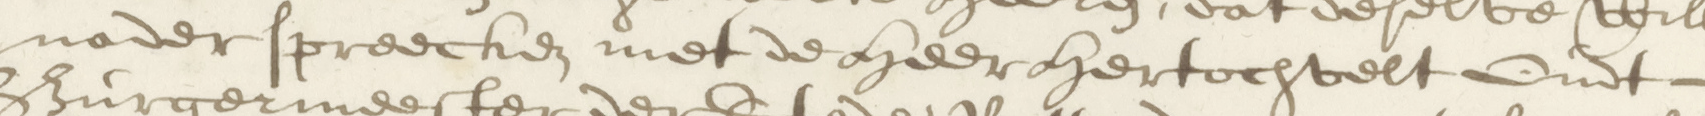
nader spreecken met de heer Hertochvelt Oudt-
